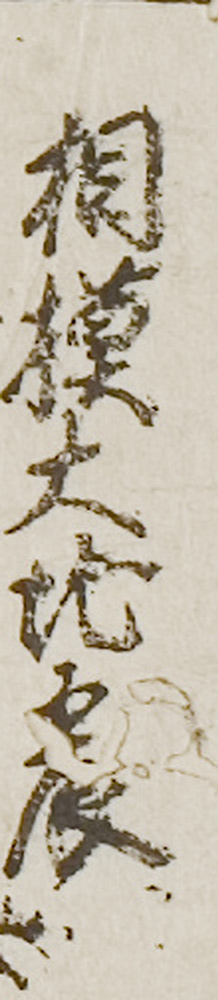相模大地震
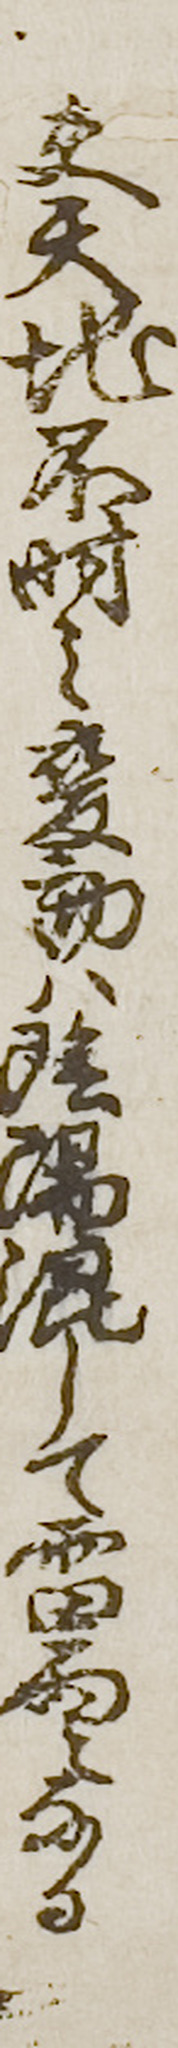夫天地不時之変動ハ陰陽混して雷雨ニなる
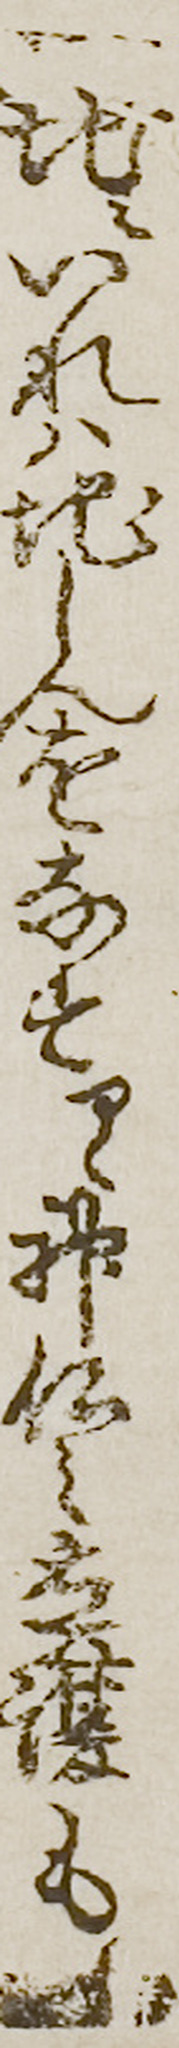地ニいれハ地しんをなすアヽ神仏之応護も
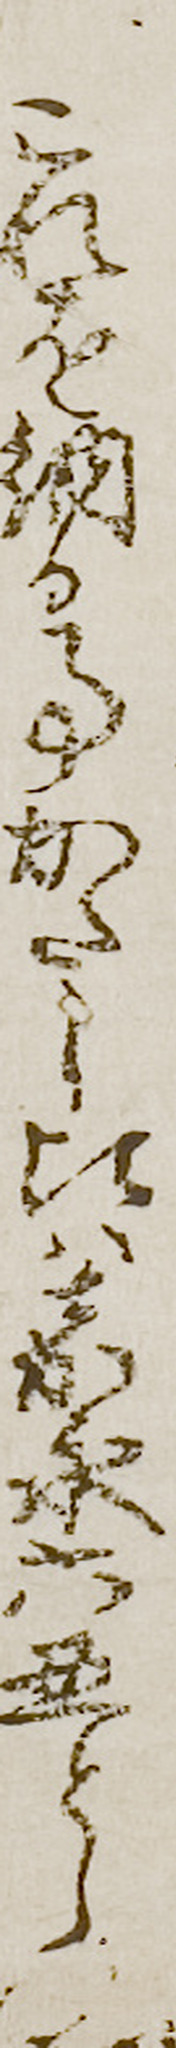これを納る事かたし比ハ嘉永六丑とし
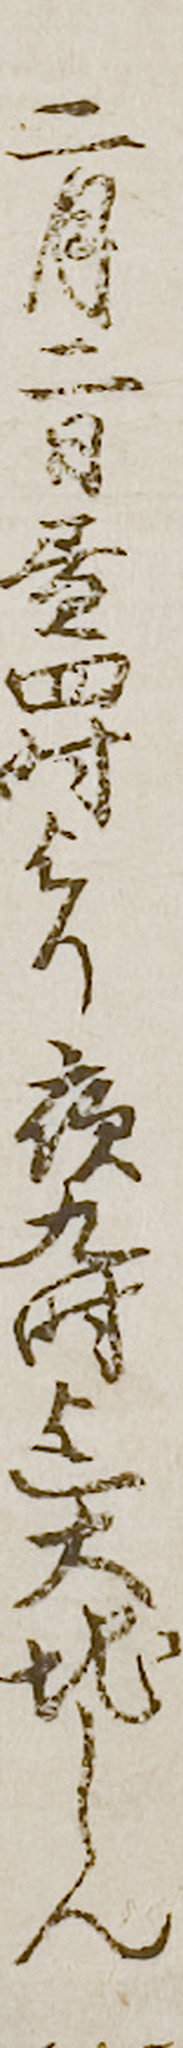二月二日昼四時より夜九時迄大地しん
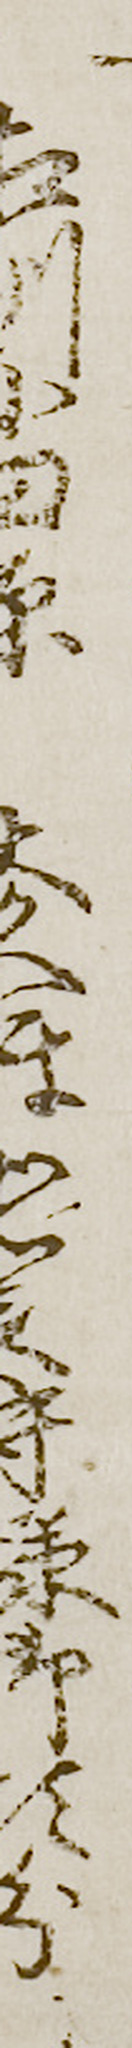相州小田原大久保加賀守様御領分
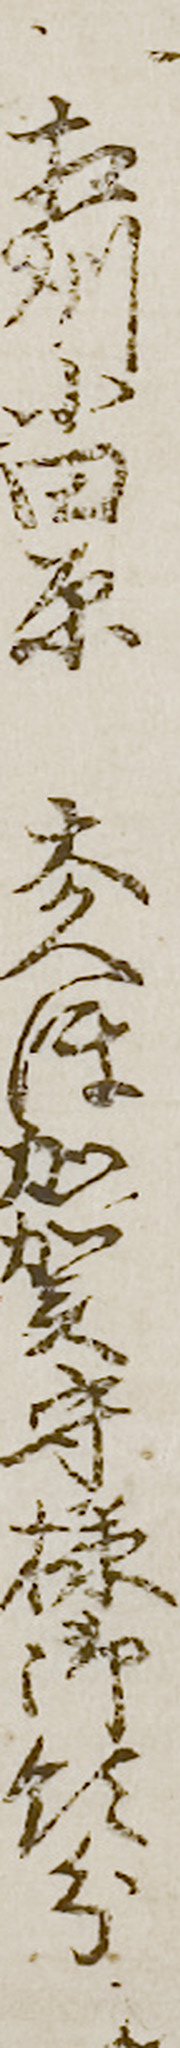相州小田原大久保加賀守様御領分
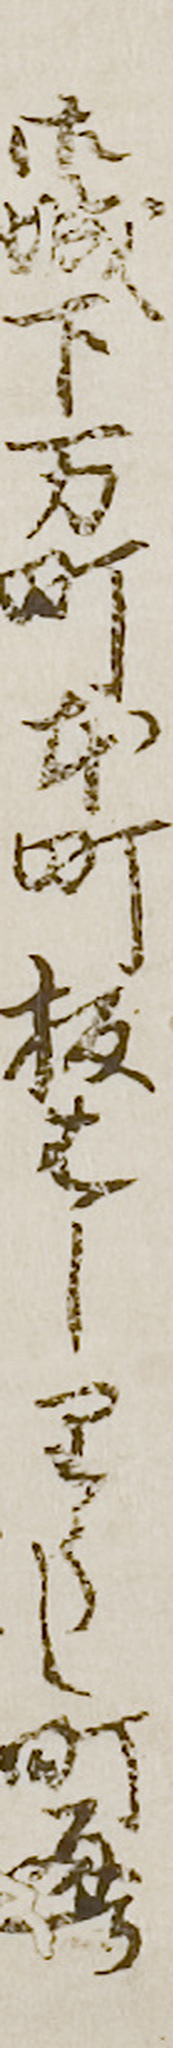御城下万町本町板はしりうし町通り
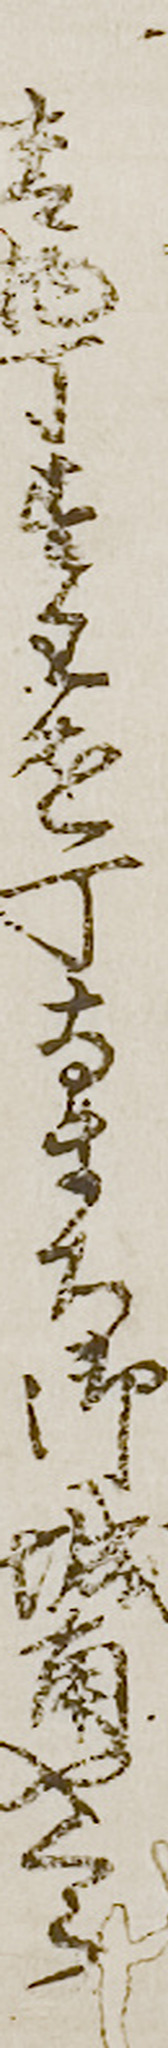青物丁すとを丁寺まち御城角やくら
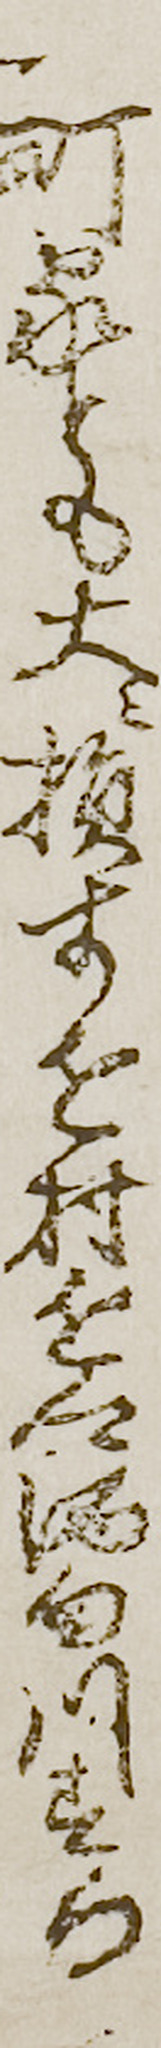町家とも大ニ損す近村近郷酒匂川すち
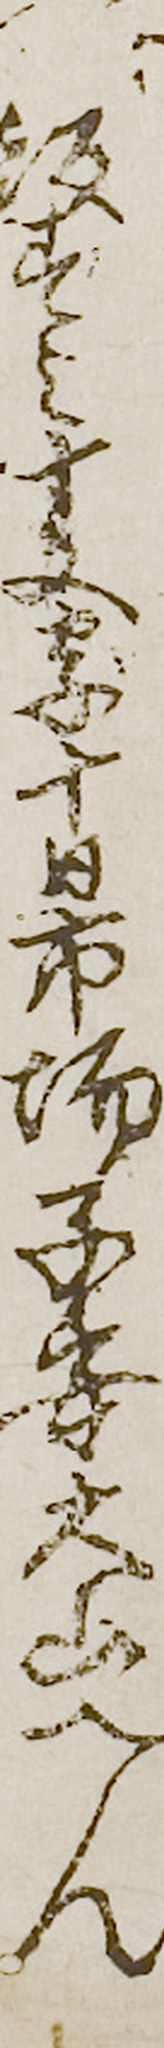飯すミ十文字十日市場子安大山へん
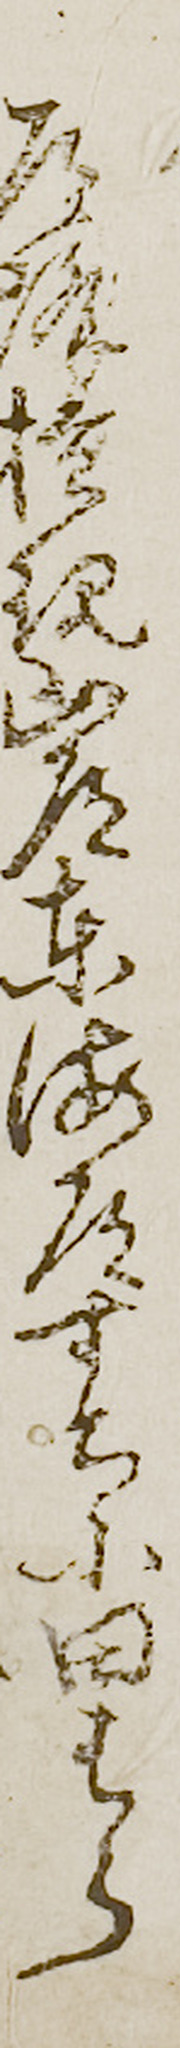道降権現山道東海道すち小田はら
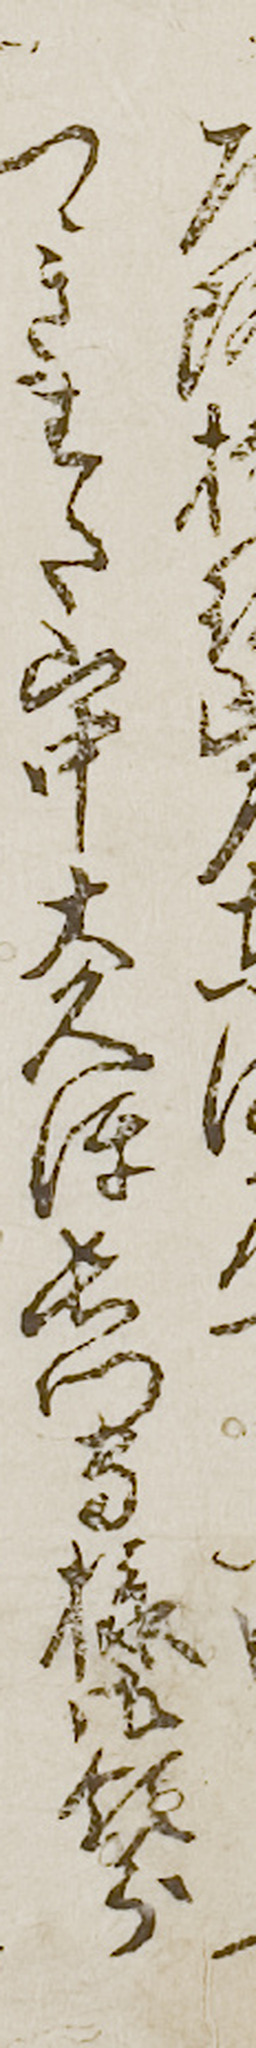つゝきはた山中大久保長門守様御領分
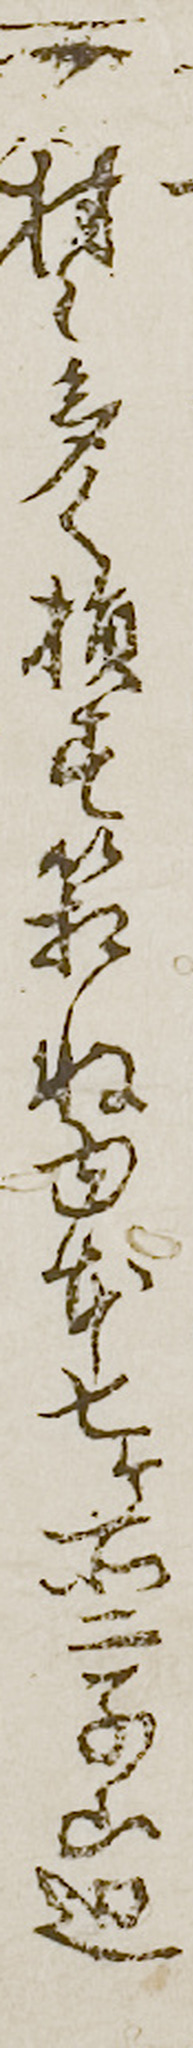村〻多く損す箱ねゆ本七ヶ所二子山辺
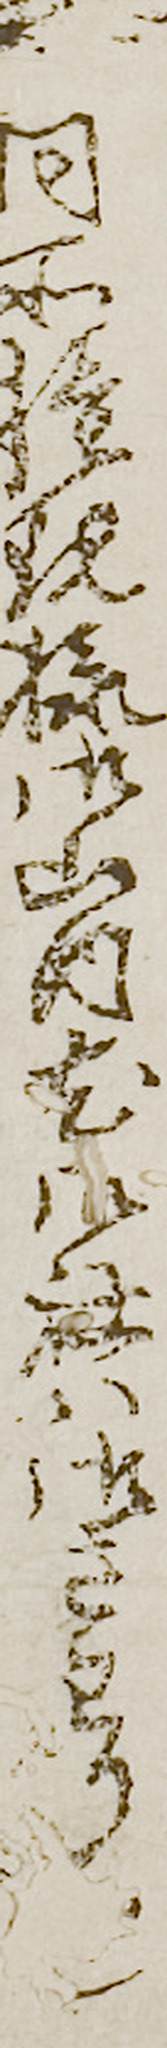同所権現様御山内尤御社ハ御さわり
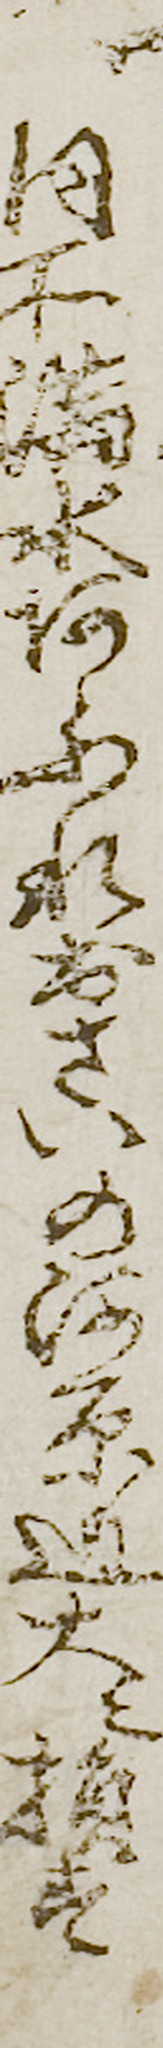同所満水あふれ出さいの河原辺大ニ損す
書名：相模大地震
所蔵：東京大学総合図書館 General Library in the University of Tokyo, JAPAN
